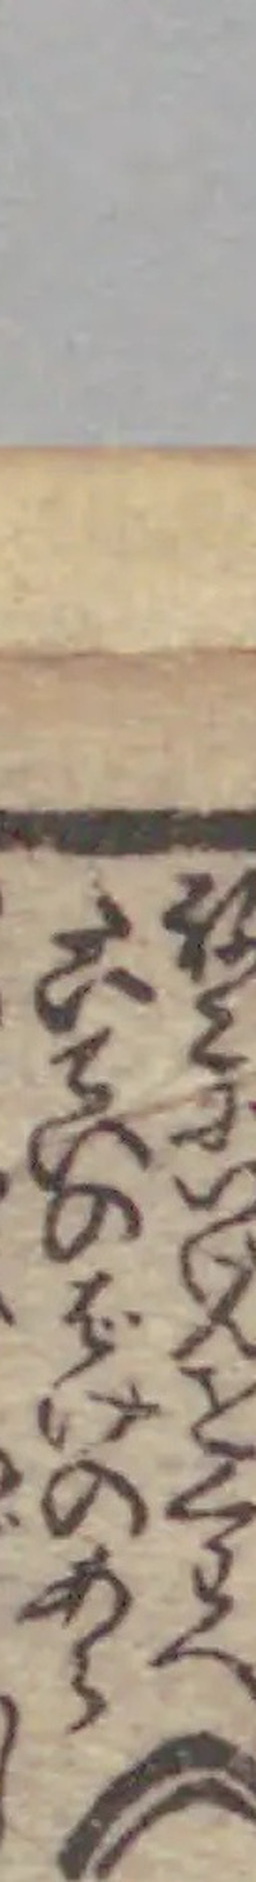たいていのばけのあら
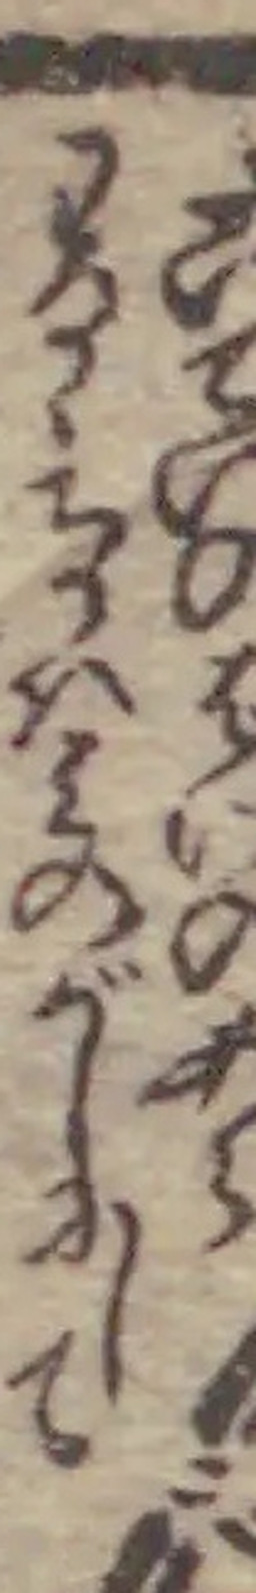わるゝ事はみのがしにして
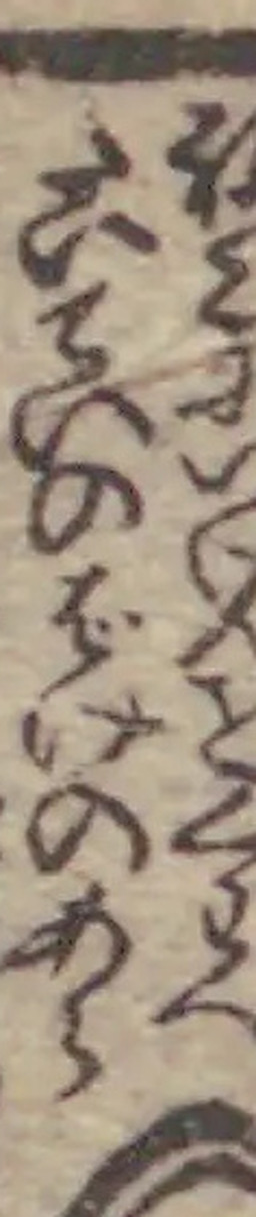たいていのばけのあら
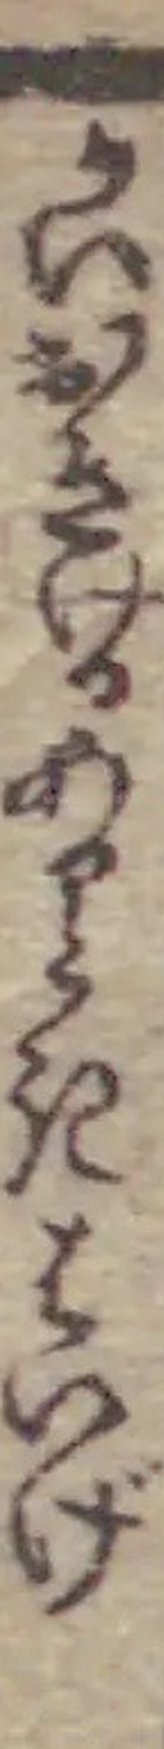かいおきけるあるときはいげ
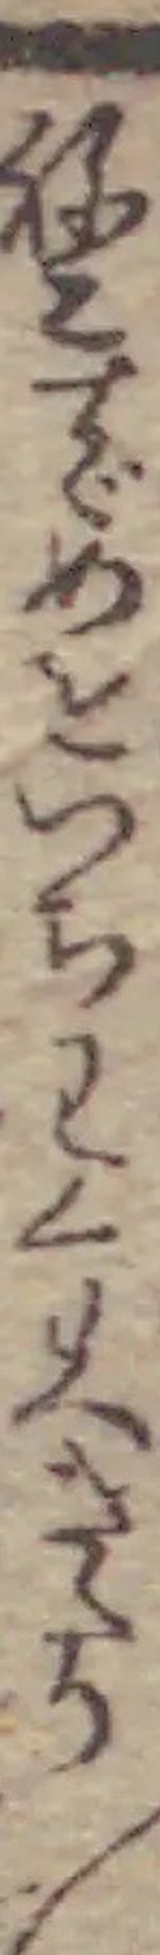ねこすゞめをいちわくわへきたり
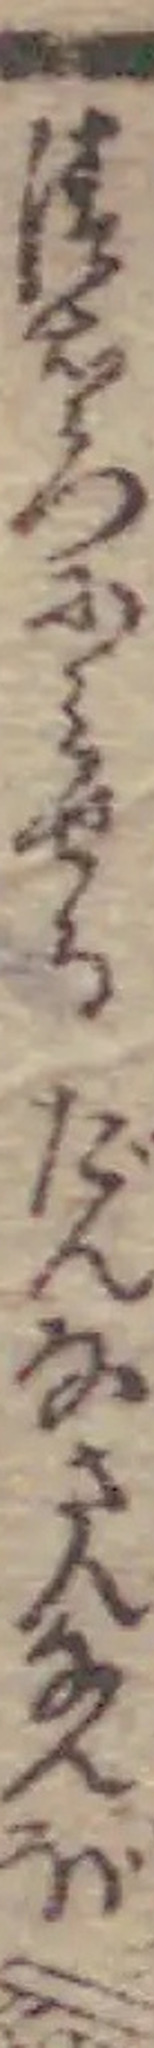清右エ門にみせるだんなさんなんぼ
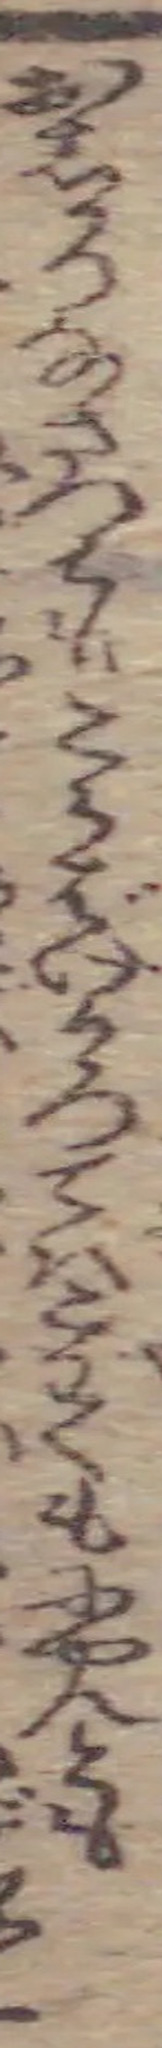おしかりなさつてもこうばけかゝつてはこわくもにやんとも
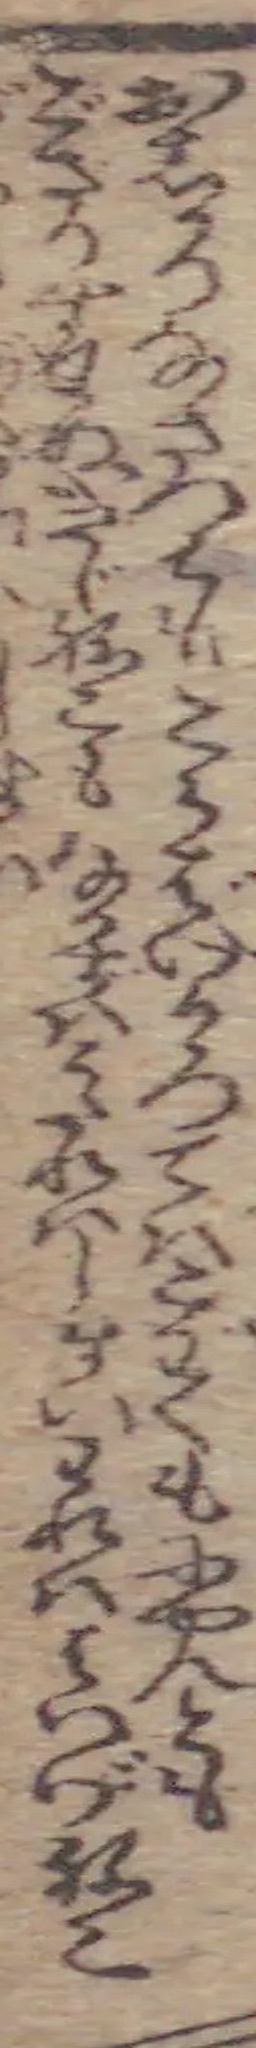ござりませぬきじねこもなかずはうたれはしまいわれははいげねこ

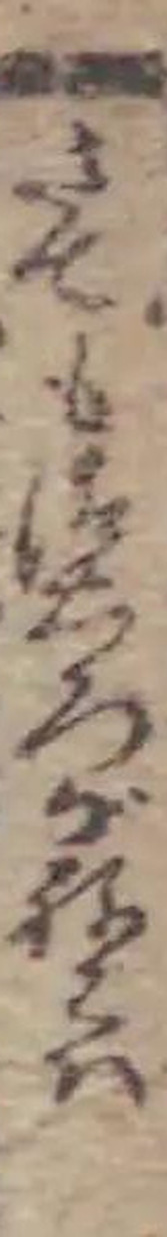さても清右エ門がねこは
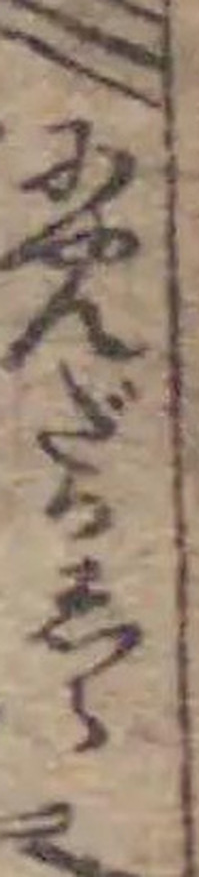にやんだかしら
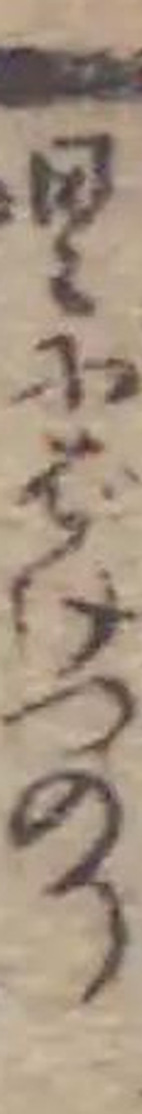日々にばけつのり
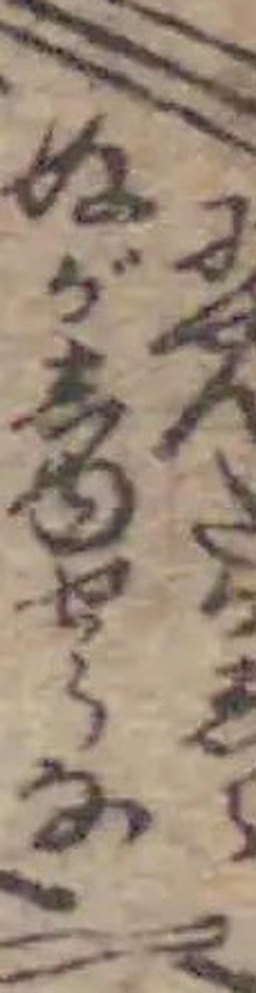ぬがしゆせうな
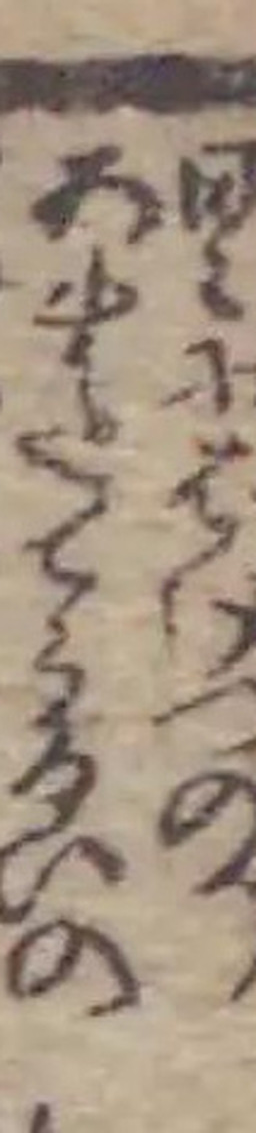あまたてうるいの
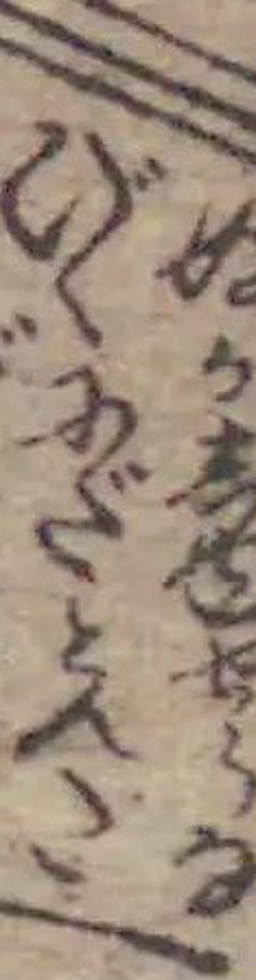びくにだとんだ
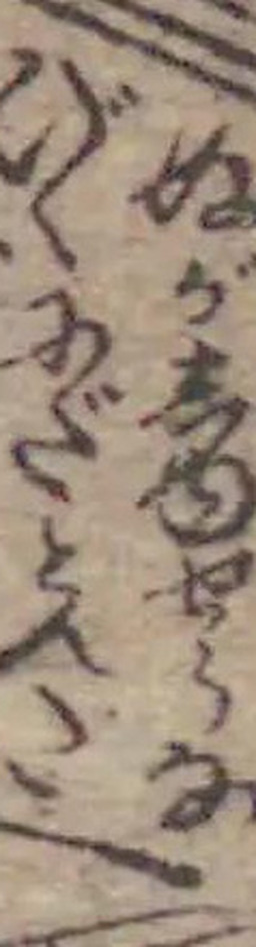びくにだとんだ
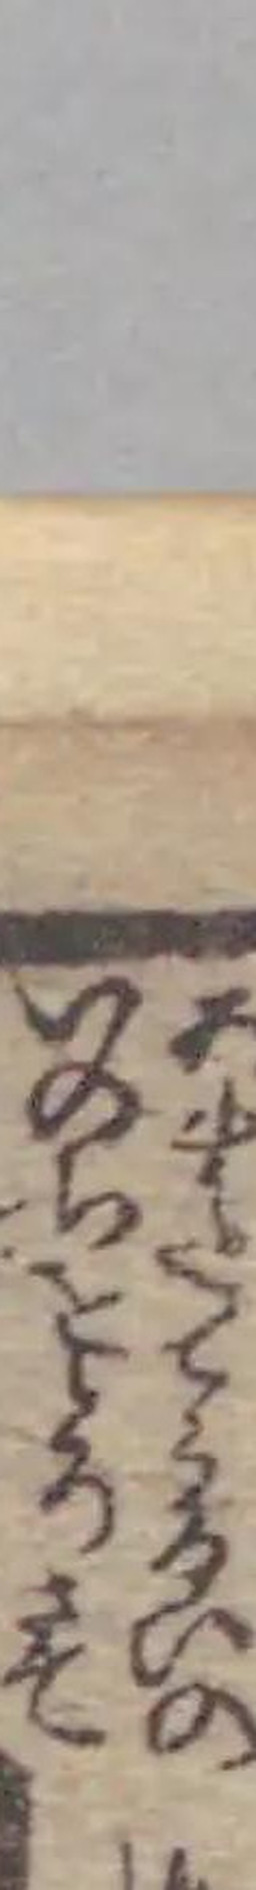いのちをとりさて
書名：冷水灰毛猫 2巻
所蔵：国立国会図書館 National Diet Library, JAPAN
